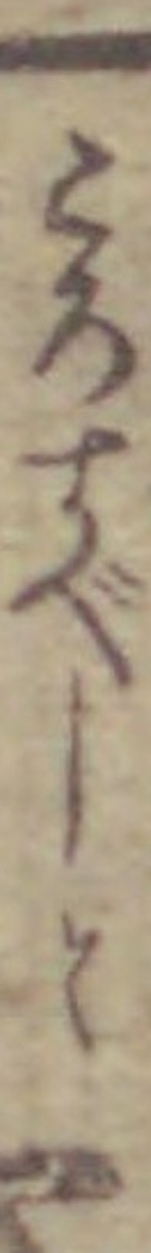ころすべしと
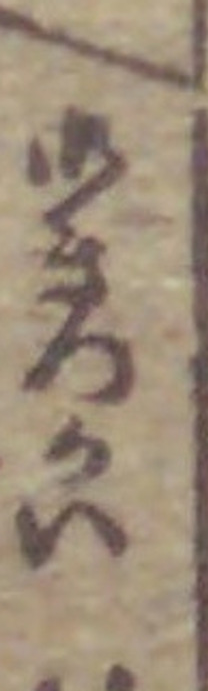御きつかい
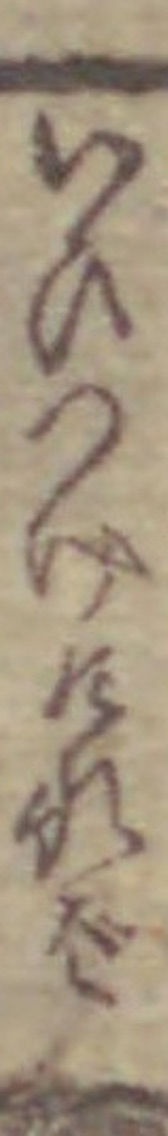いひつけければ
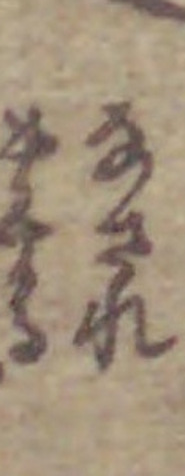なされ
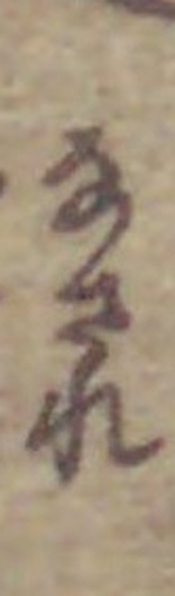なされ
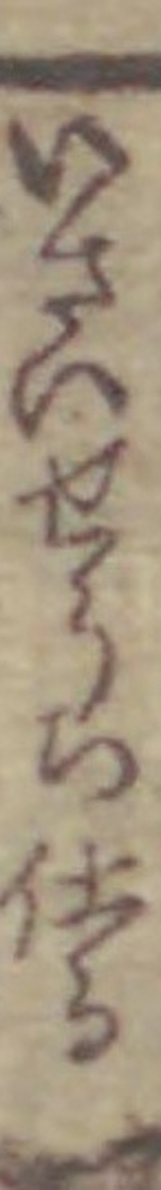いさいせうち仕る
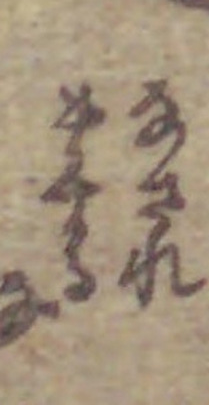なされ
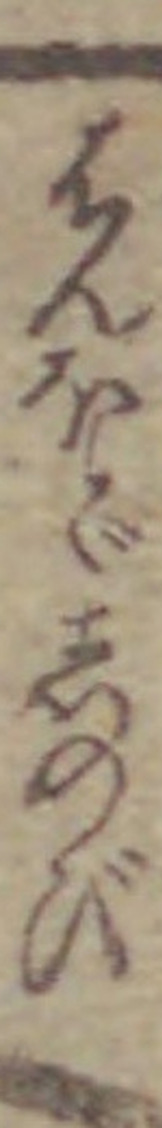はんほどしのび
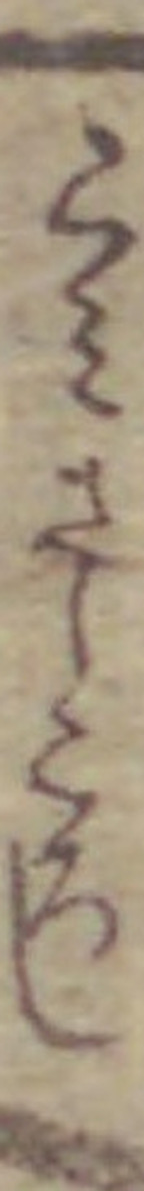こみさしころし
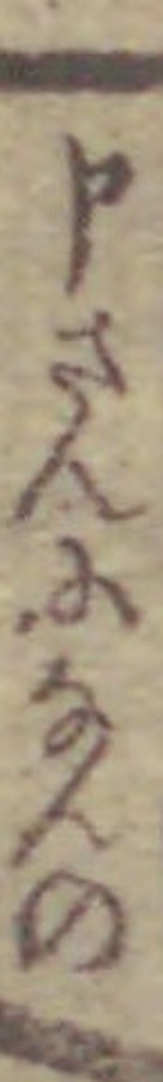申さんになんの
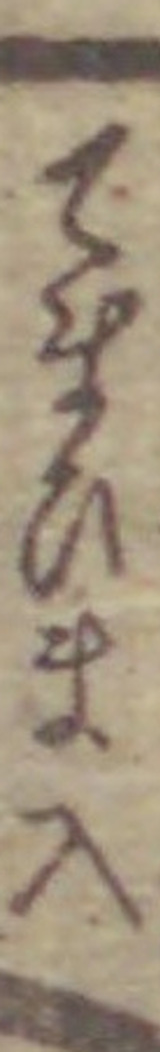てまひま入
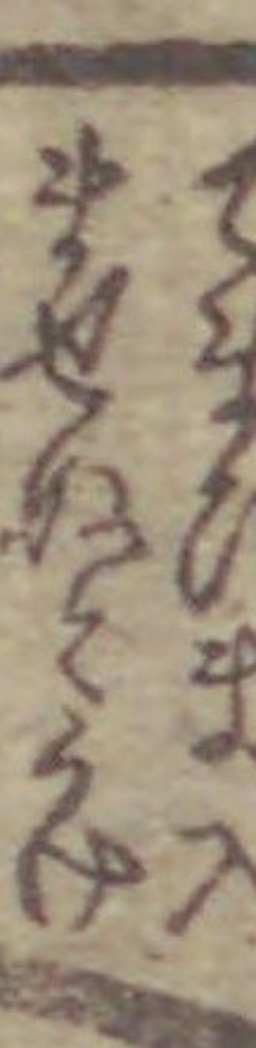ませぬとうけ
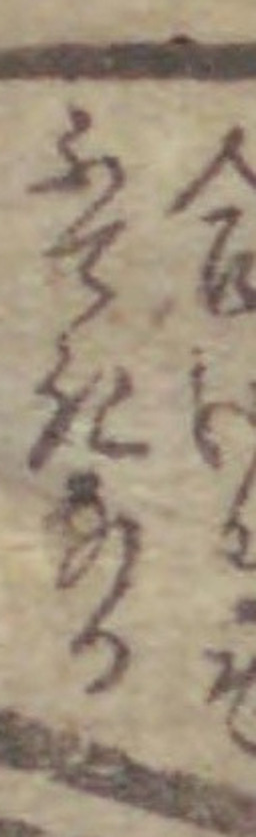ふてきなり

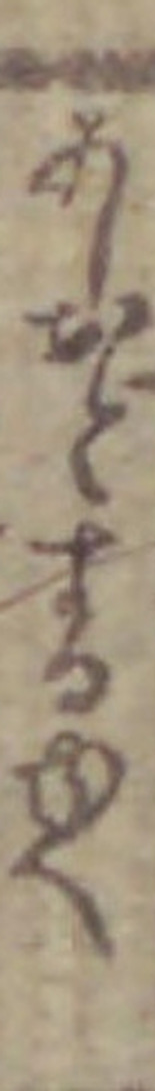あしおとするゆへ
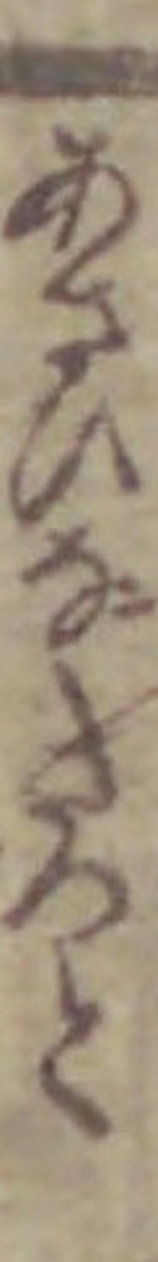あさひなきつと
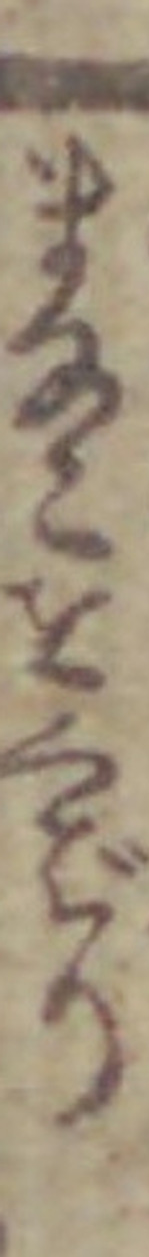まなこをくばり
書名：鎌倉山紅葉浮名
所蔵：国立国会図書館 National Diet Library, JAPAN
